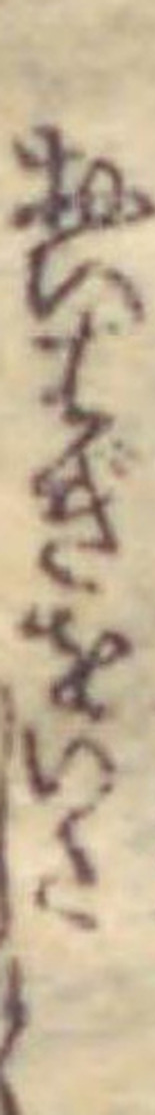おいはぎをいた

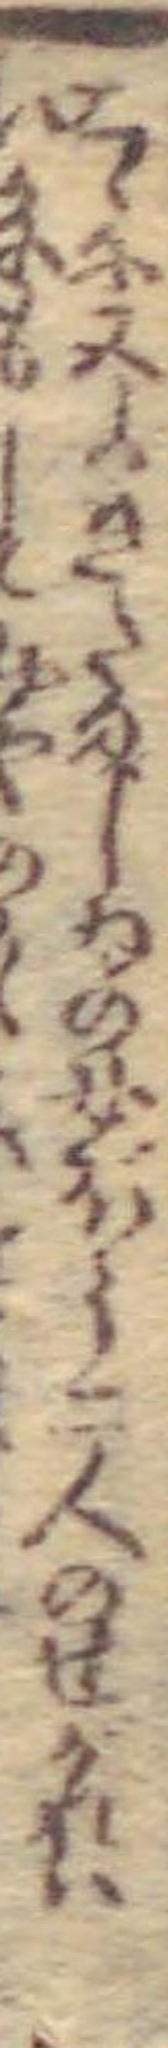こゝに又よきたましゐの女ぼう二人のせがれは
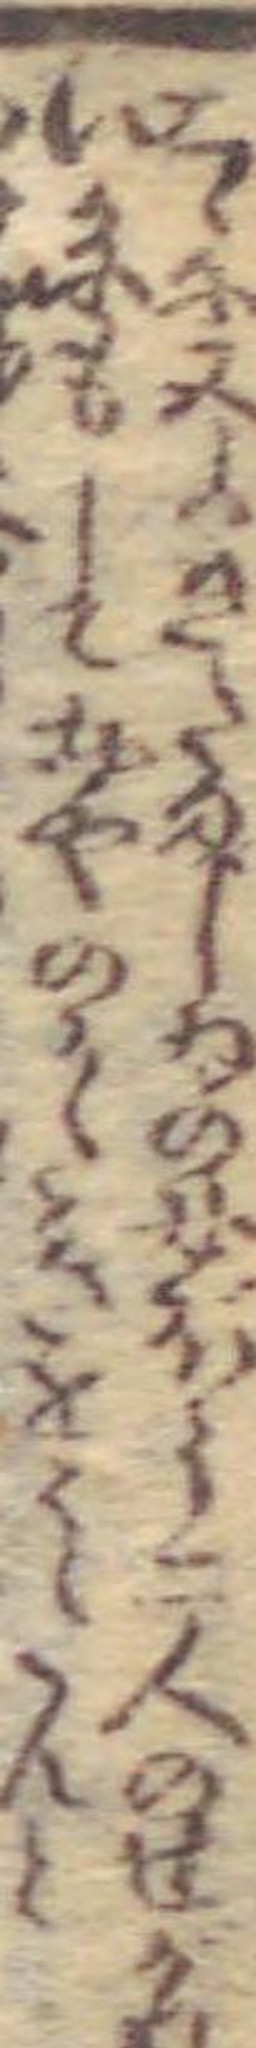いかにもしておやのかたきをうたんと
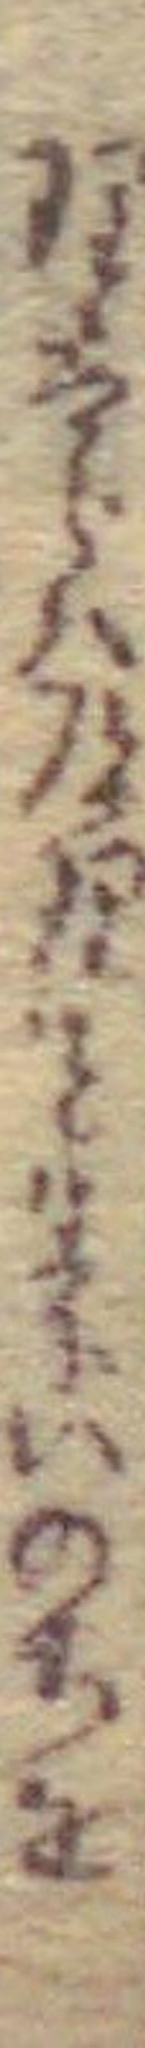理太郎は道理先生にいのちを
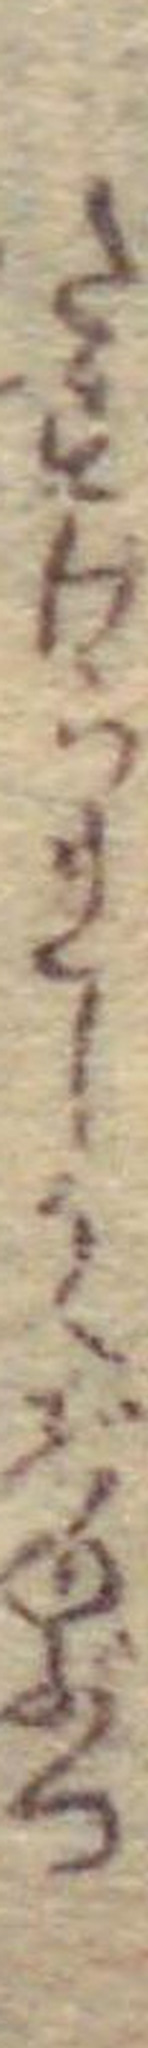たすけられしうへじゆぶつ
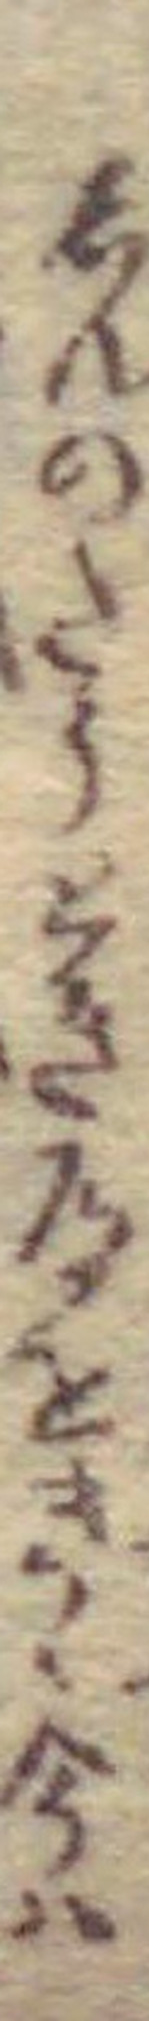しんのたうとき道をきゝ今は
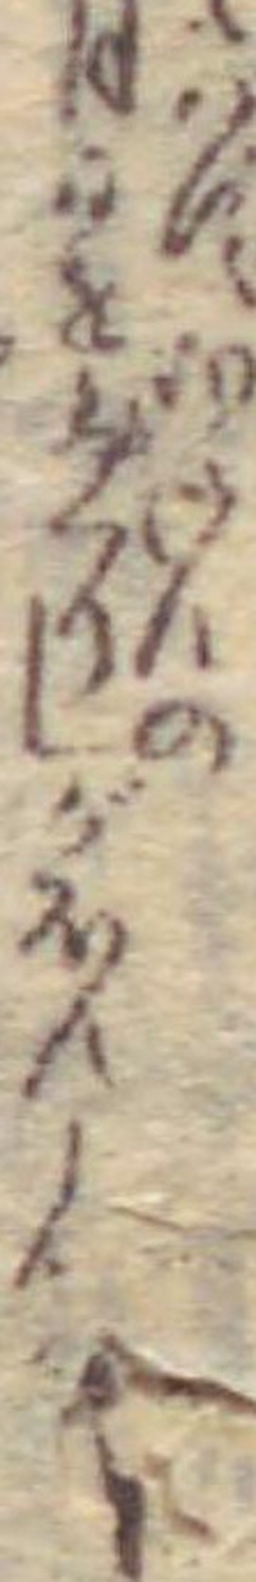月日をおくりしがほんしん
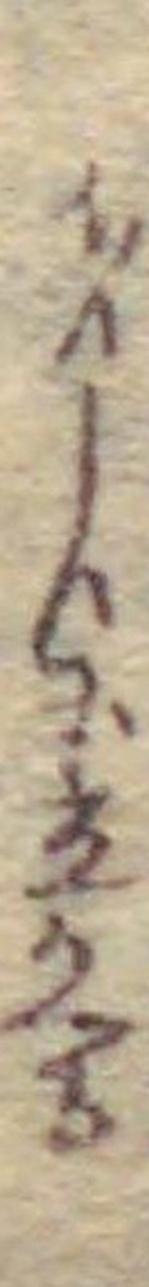ほんしんに立ちかへる
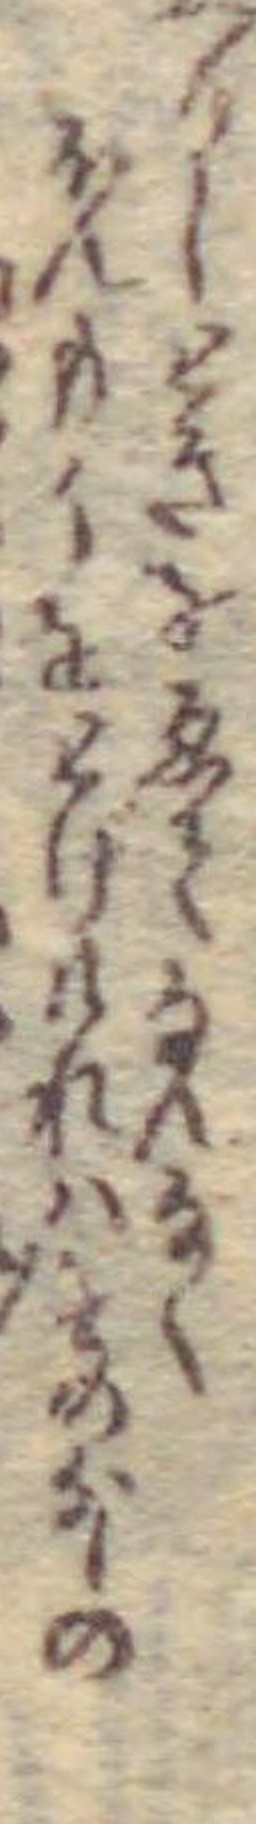ほんもうをとげけれはその外の
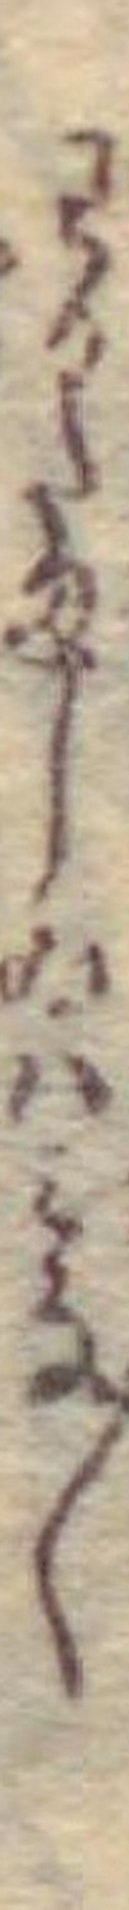わるたましゐはみな〳〵
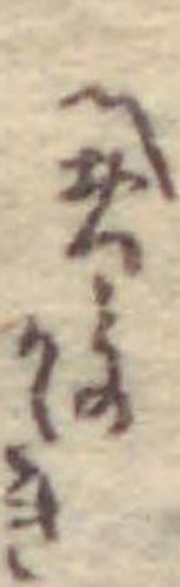〽おつとの
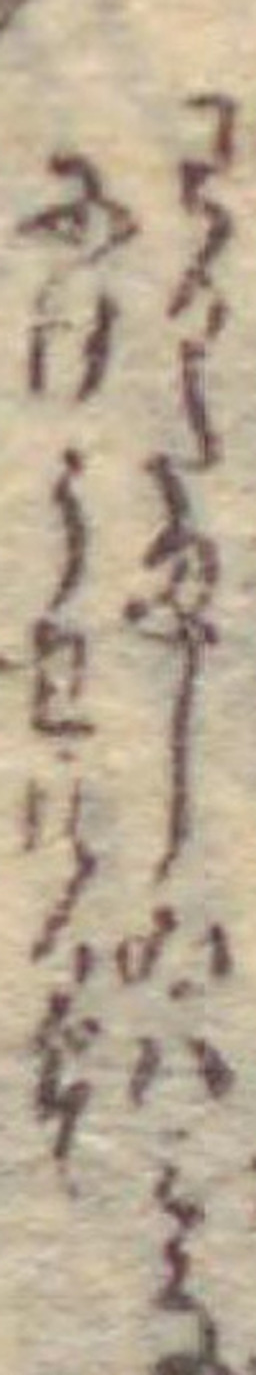にけうせけるぞ
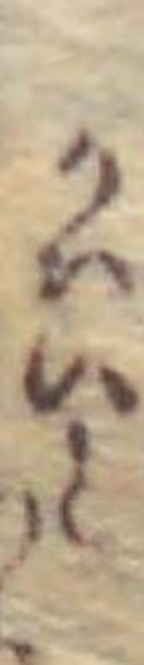かはいと
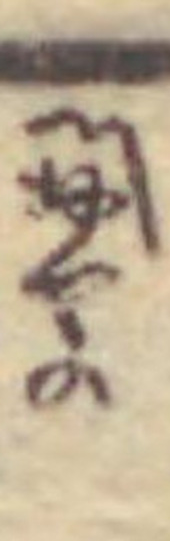〽おやの
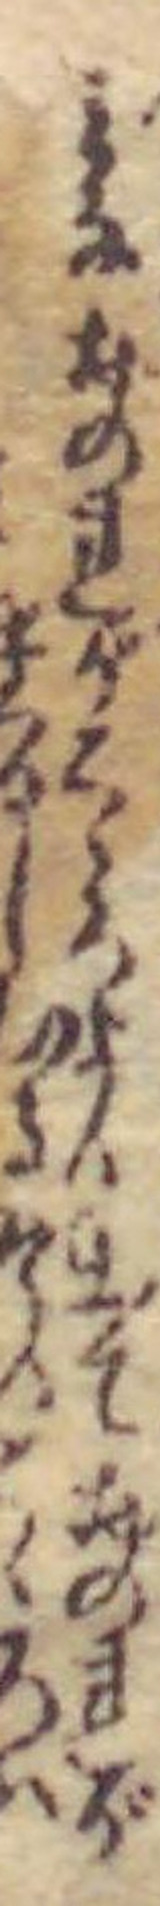みなおのれがこゝろより出ておのれが
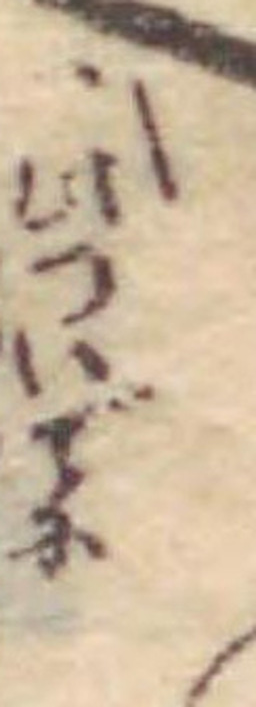〽此ついでに
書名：心学早染艸 : 3巻
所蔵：国立国会図書館 National Diet Library, JAPAN
